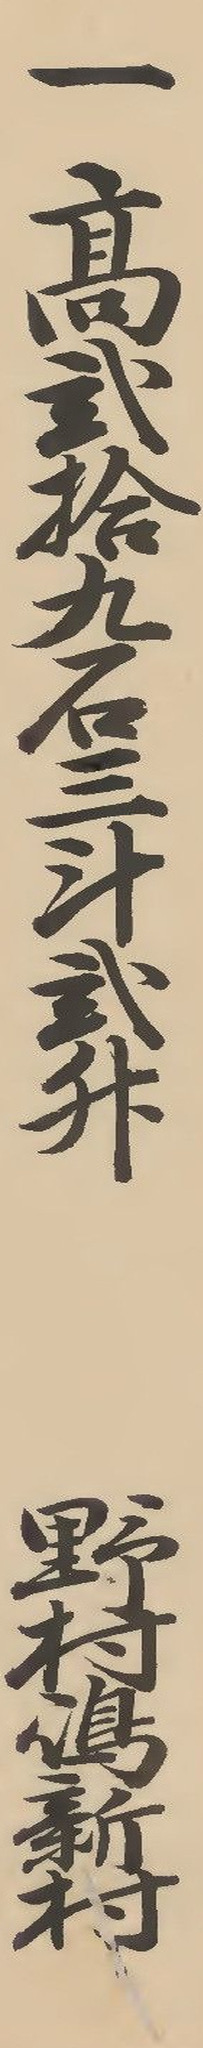一高弐拾九石三斗弐升野村島新村
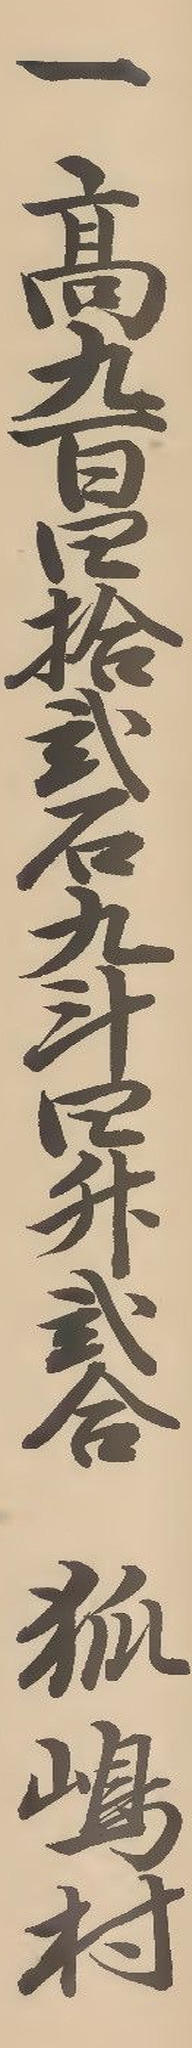一高九百四拾弐石九斗四升弐合狐島村
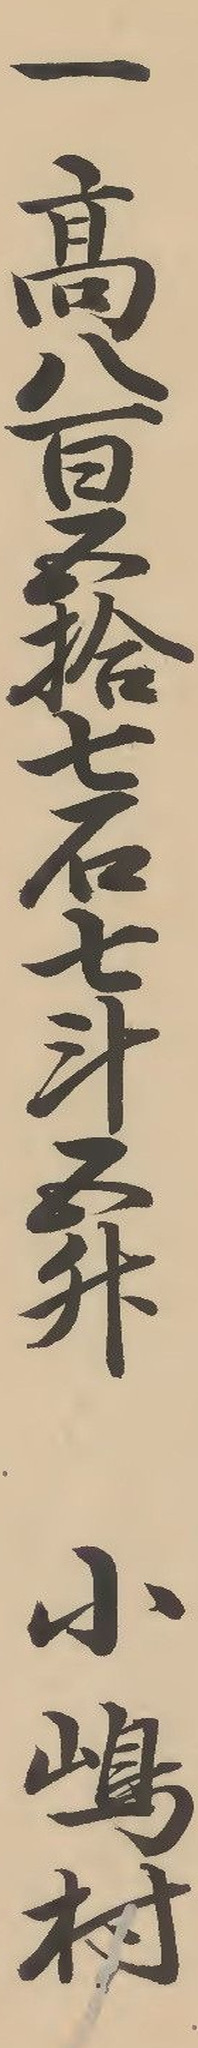一高八百五拾七石七斗五升小島村
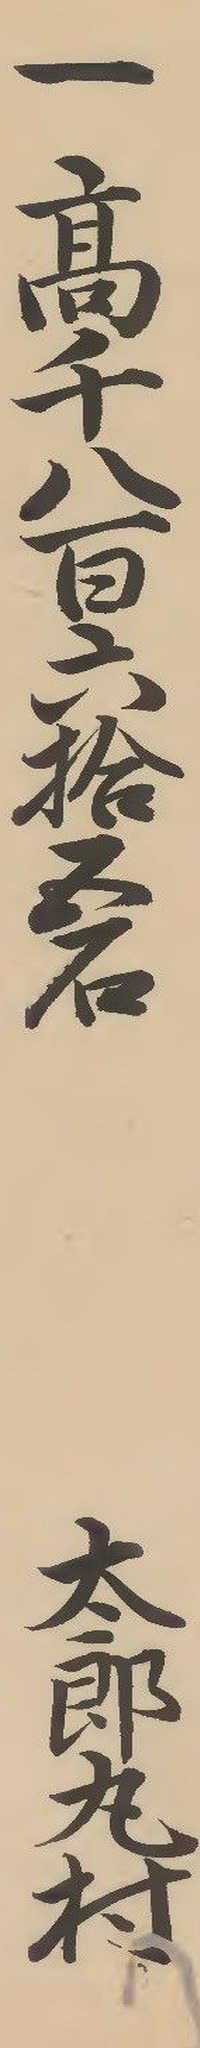一高千八百六拾五石太郎丸村
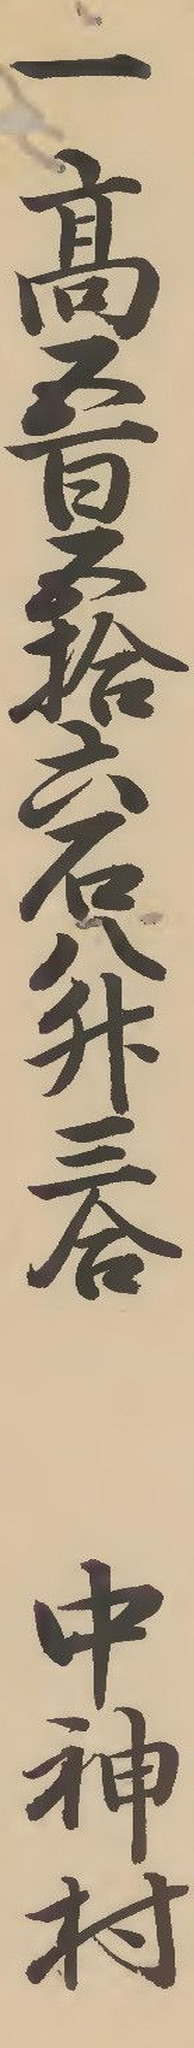一高五百五拾六石八升三合中神村

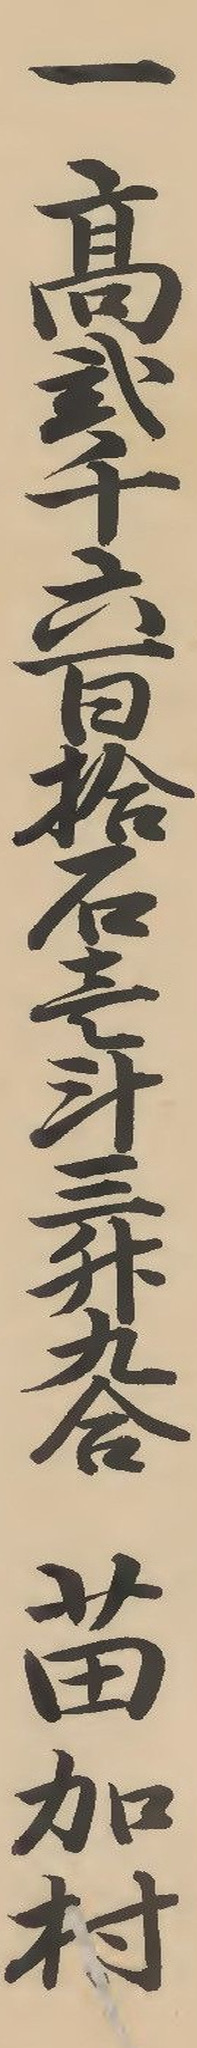一高弐千六百拾石壱斗三升九合苗加村
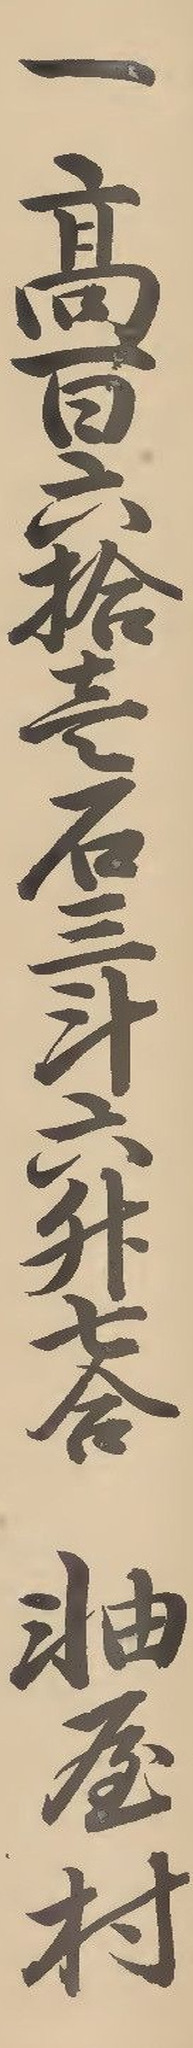一高百六拾壱石三斗六升七合軸屋村
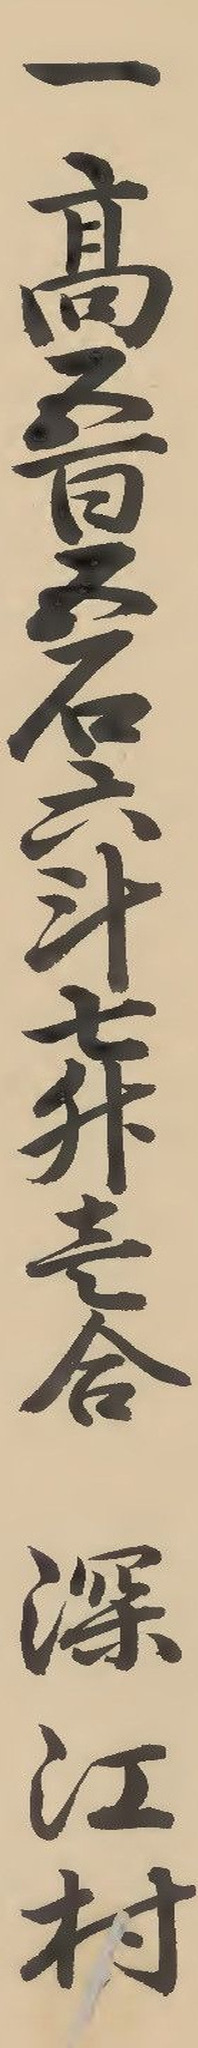一高五百五石六斗七升壱合深江村
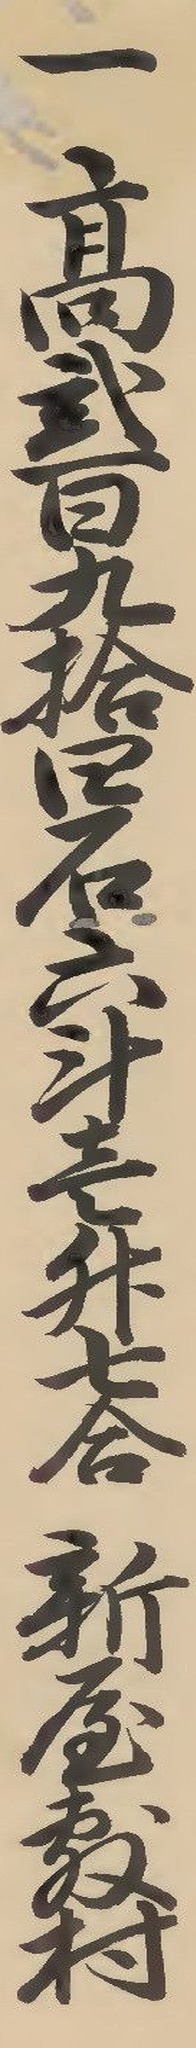一高弐百九拾四石六斗壱升七合新屋敷村

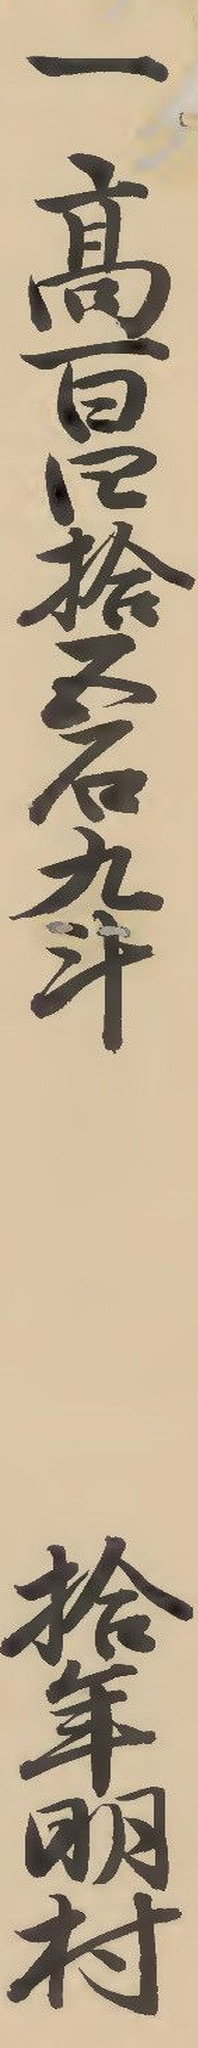一高百四拾五石九斗拾年明村
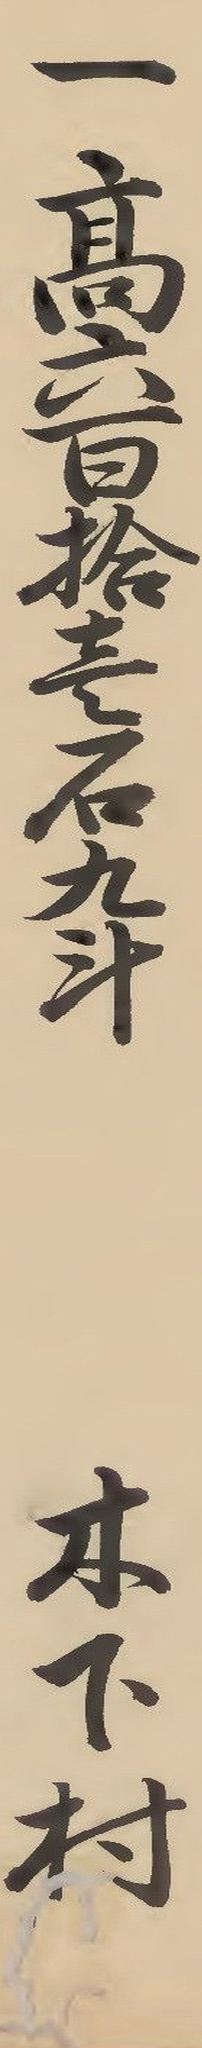一高六百拾壱石九斗木下村
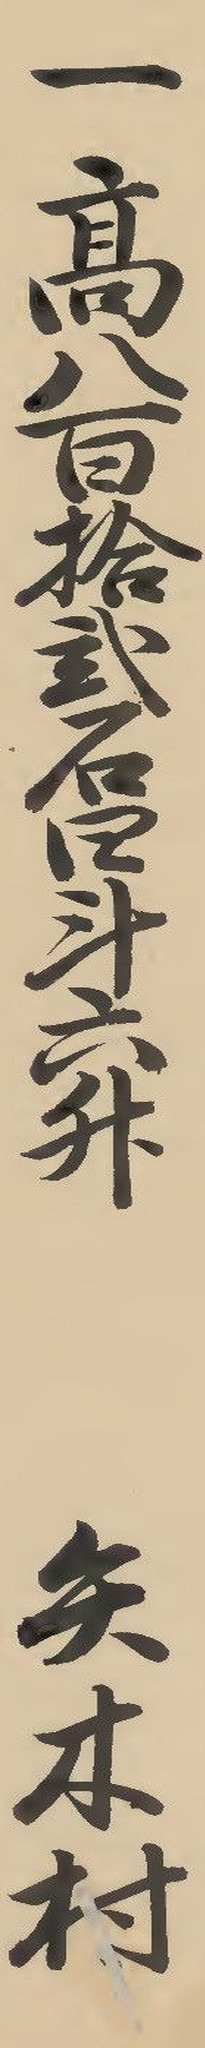一高八百拾弐石四斗六升矢木村
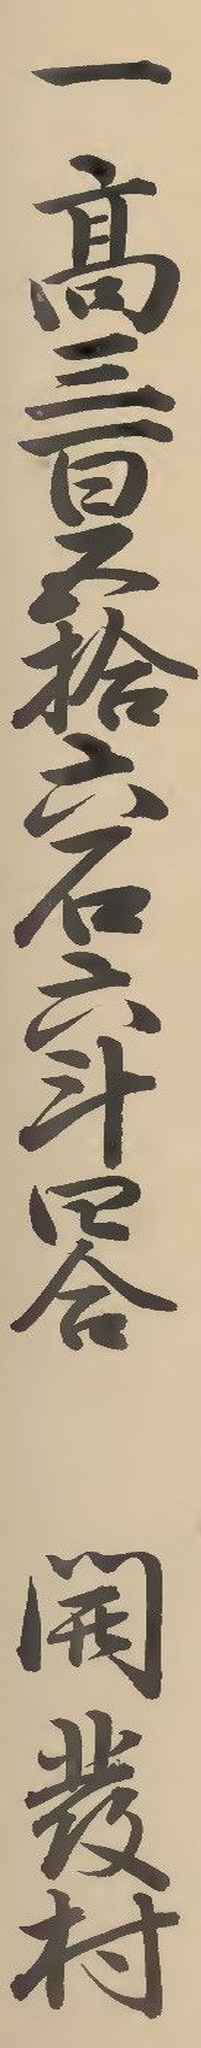一高三百五拾六石六斗四合開発村
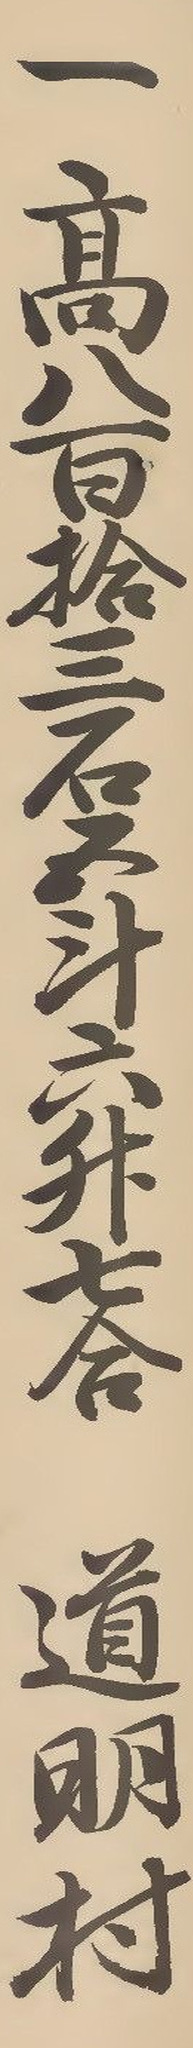一高八百拾三石五斗六升七合道明村
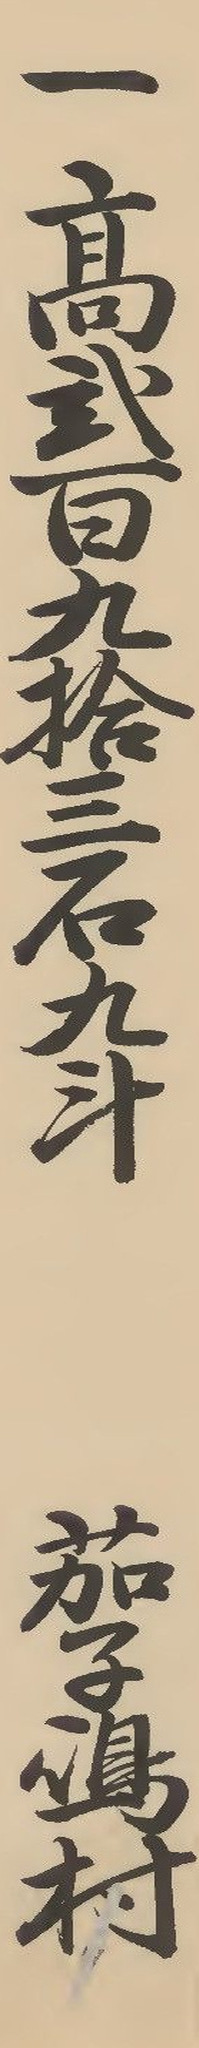一高弐百九拾三石九斗茄子島村
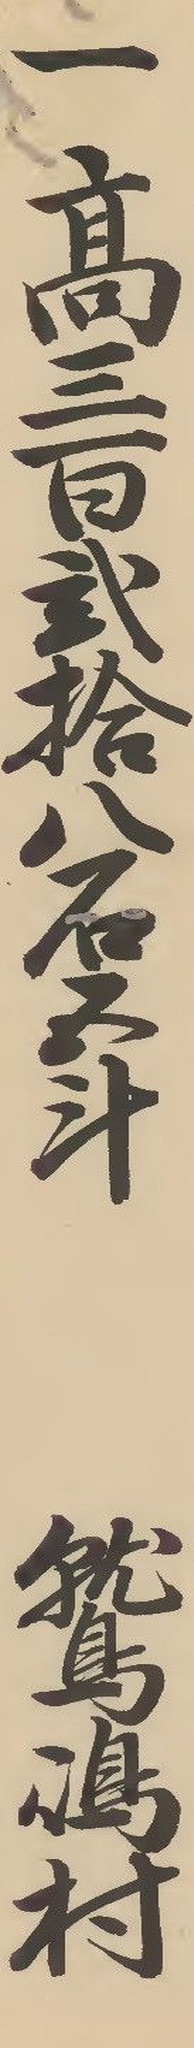一高三百弐拾八石五斗鷲島村
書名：越中国郷帳
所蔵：国立公文書館 National Archives of Japan
